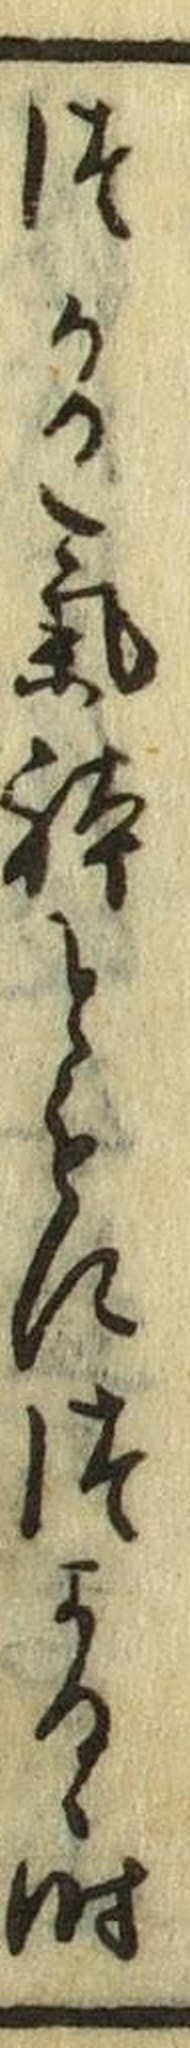つかる気体ともにつかるゝ時

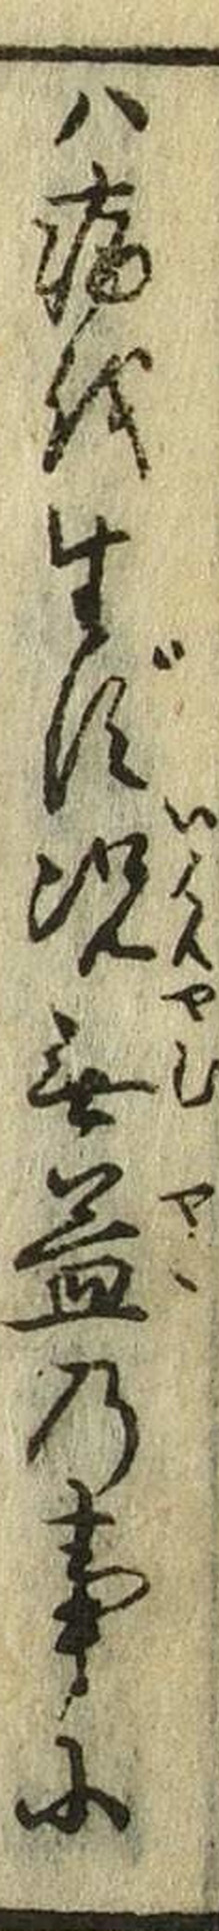は病を生ず況無益の事に
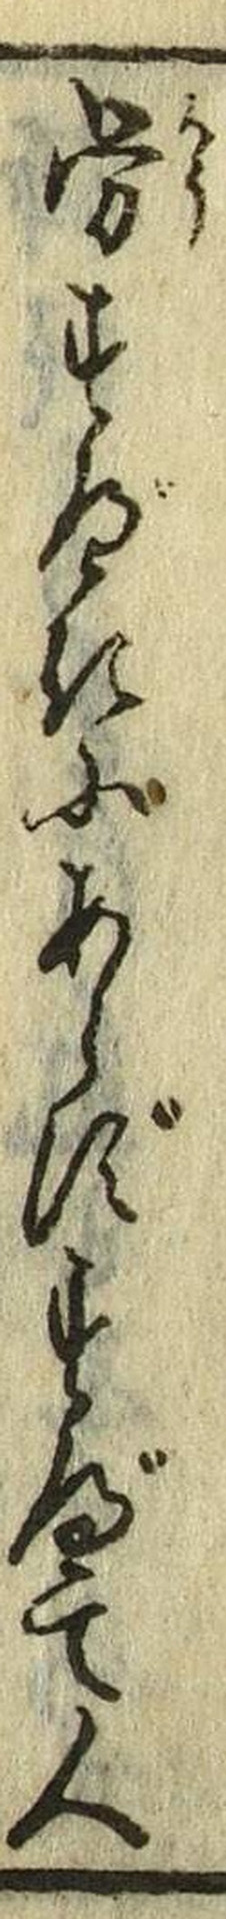労すべきにあらずすべて人
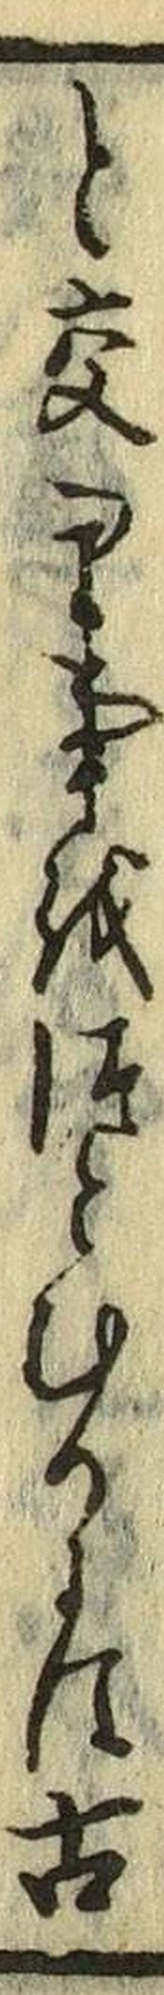と交り事をつとむるには古
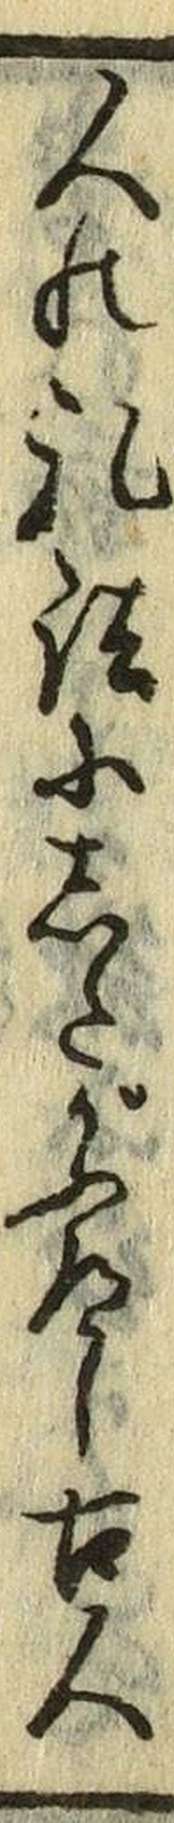人の礼法にしたがふへし古人
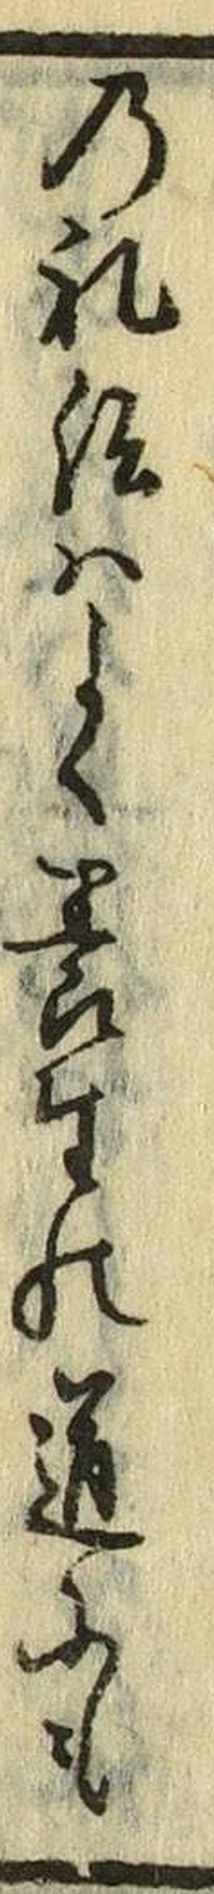の礼法はよく養生の道にも
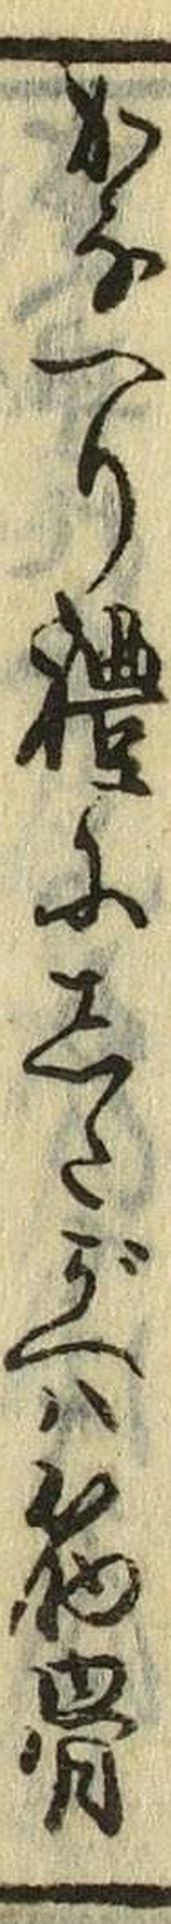かなへり礼にしたがへは筋骨
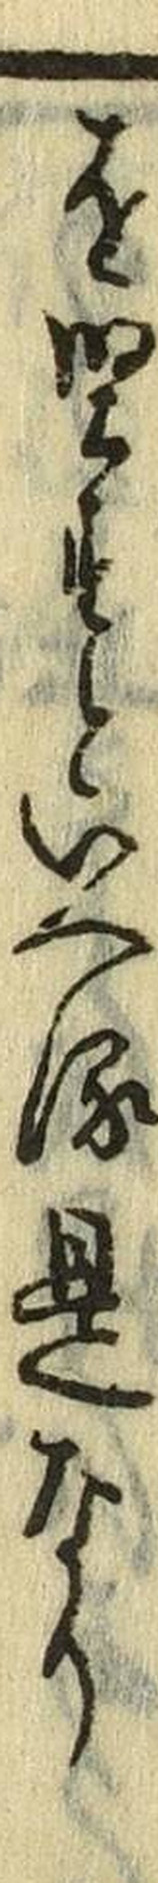を堅すといへる是なり
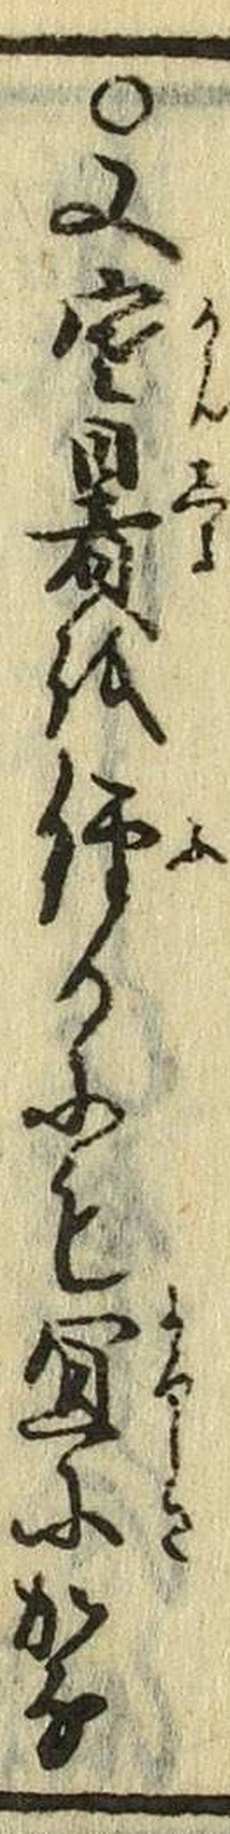○又寒暑を経るにも宜にかな
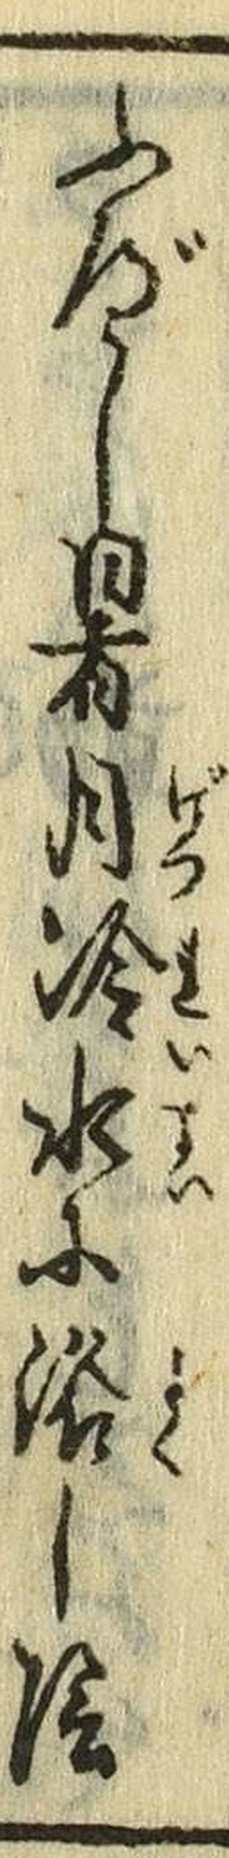ふべし暑月冷水に浴し陰
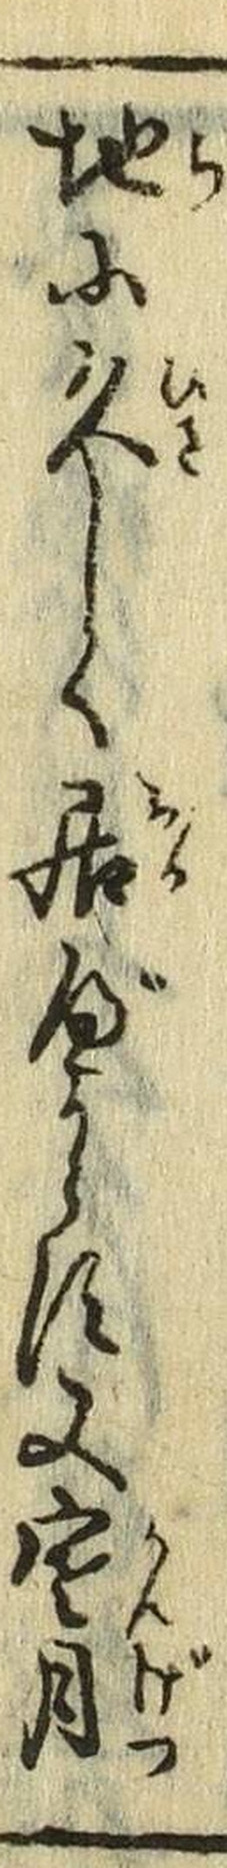地に久しく居べからす又寒月
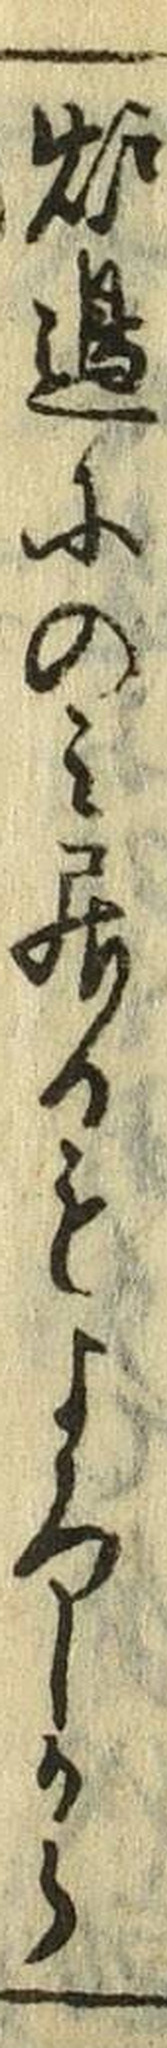炉辺にのみ居るもよろしから
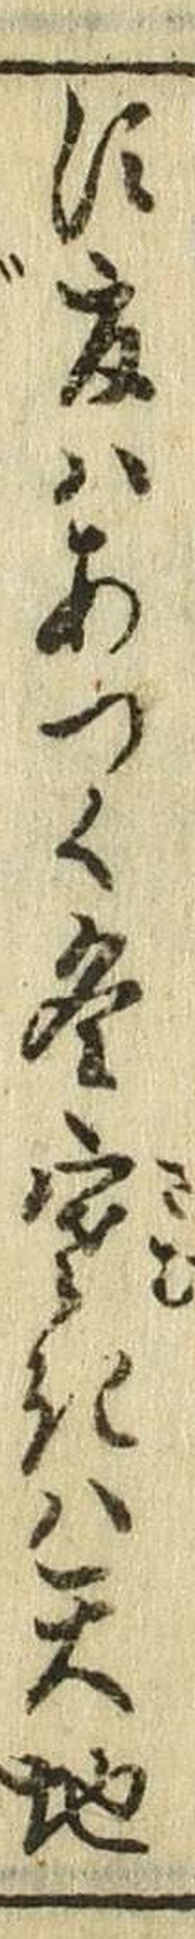す夏はあつく冬寒きは天地
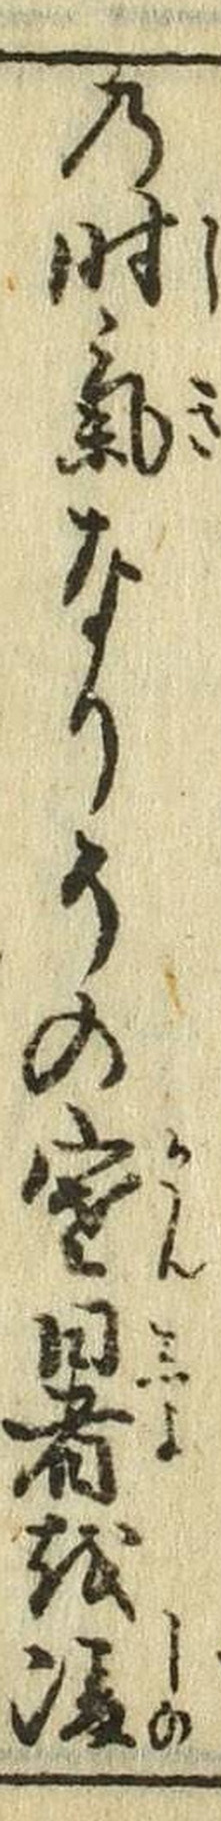の時気なりその寒暑を凌
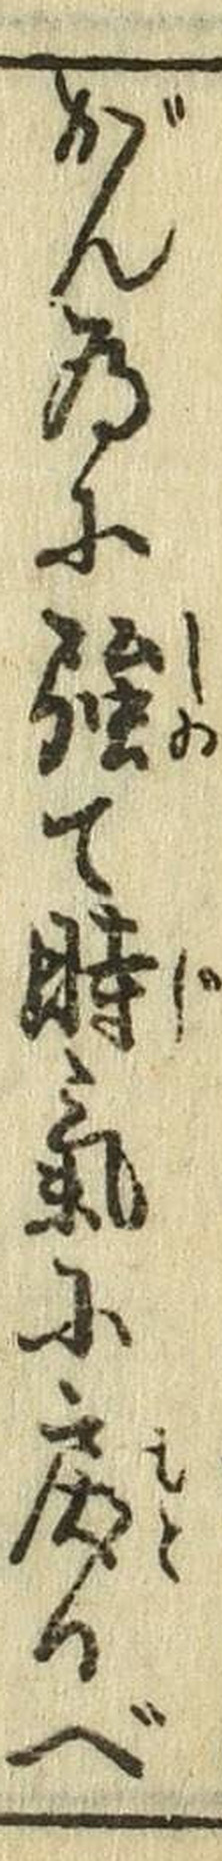がん為に強て時気に戻るべ
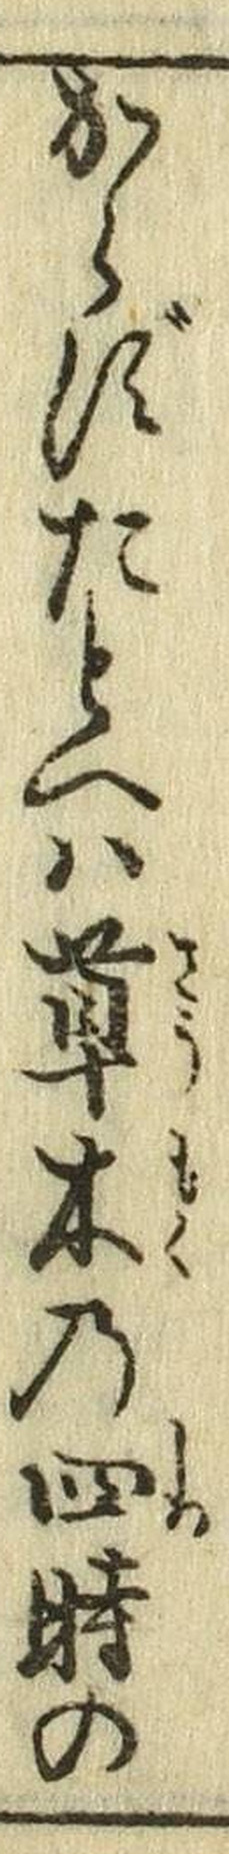からずたとへは草木の四時の
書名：居家養生記
